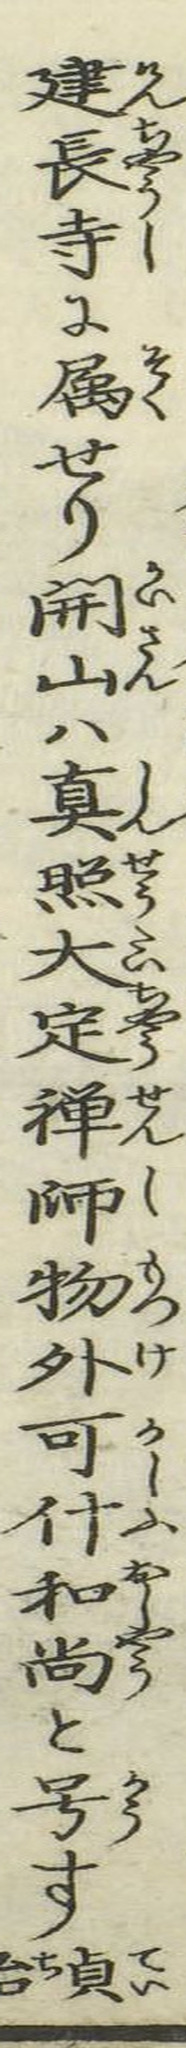建長寺に属せり開山は真照大定禅師物外可什和尚と号す貞治
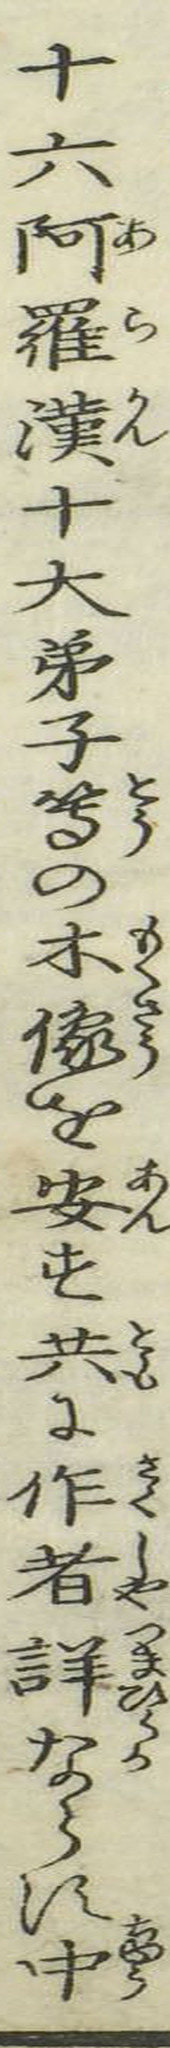十六阿羅漢十大弟子等の木像を安す共に作者詳ならす中
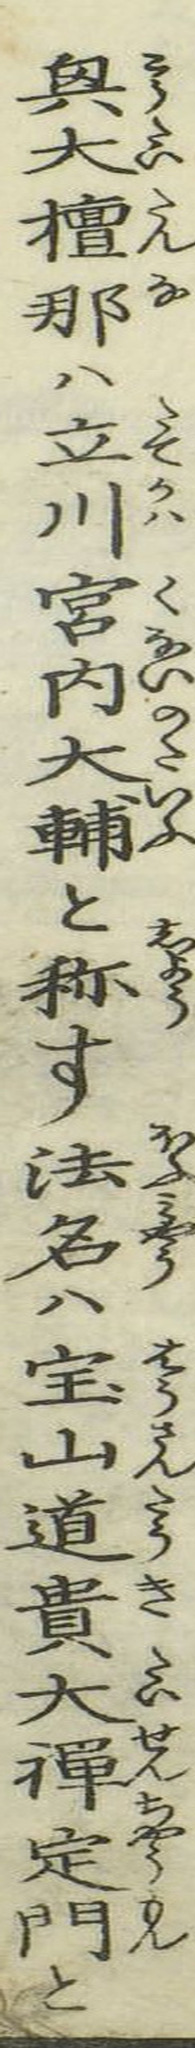興大檀那は立川宮内大輔と称す法名は宝山道貴大禅定門と

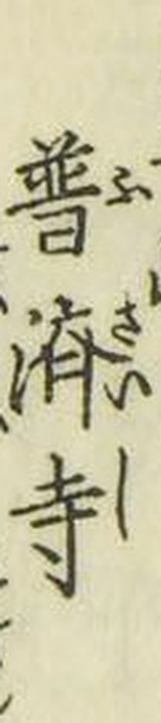普済寺
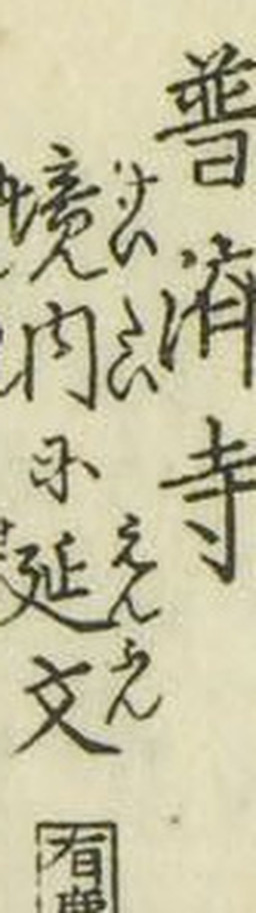境内に延文
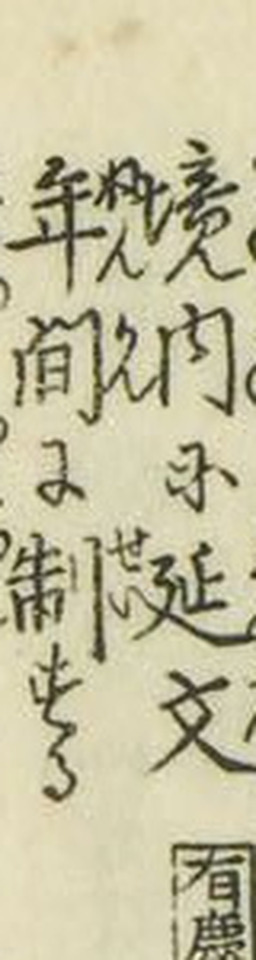年間に制する
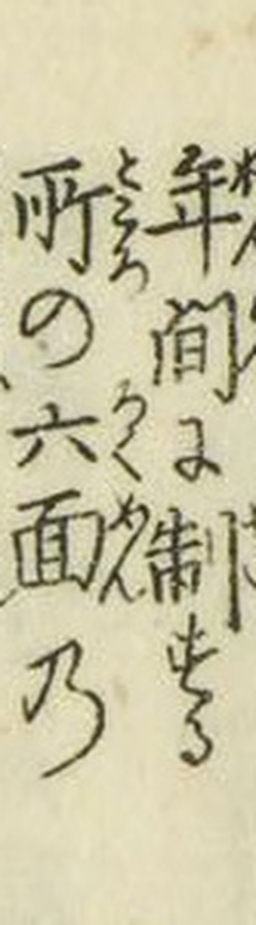所の六面の
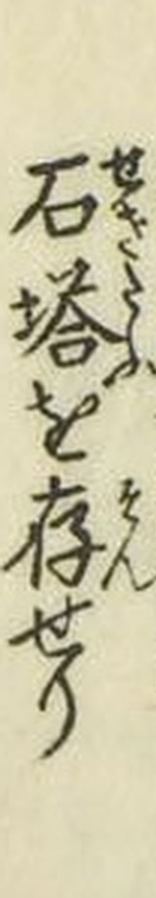石塔を存せり
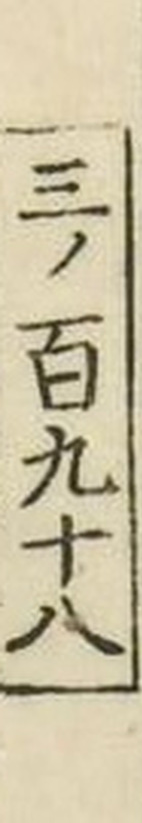三ノ百九十八

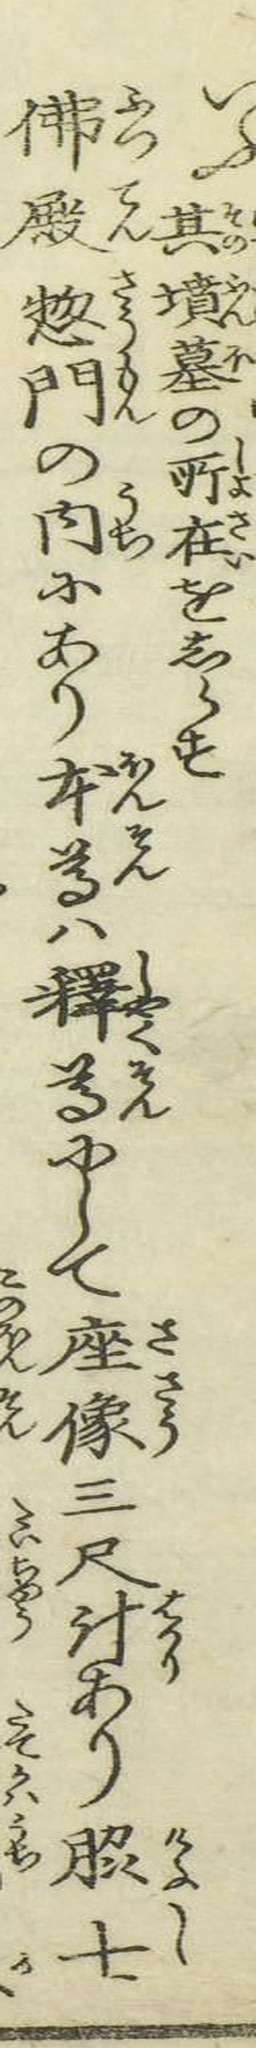仏殿惣門の内にあり本尊は釈尊にして座像三尺計あり脇士
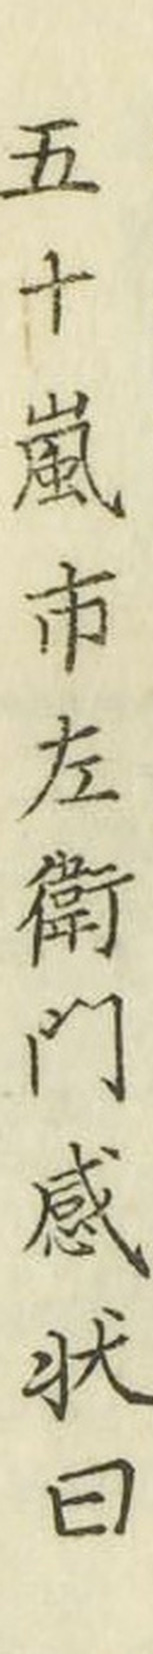五十嵐市左衛門感状曰
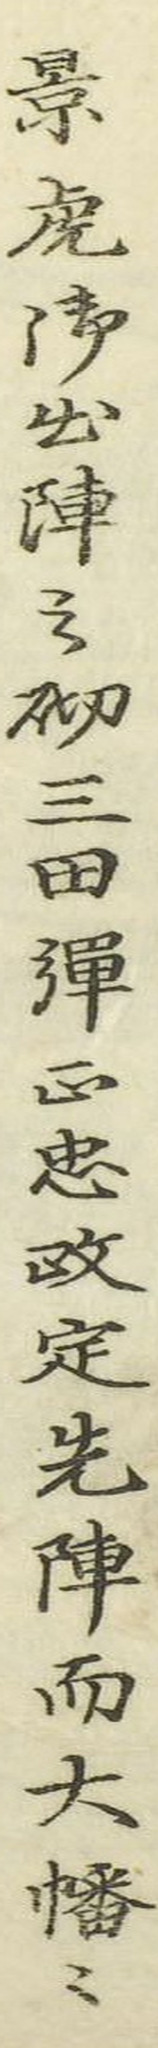景虎御出陣之砌三田弾正忠政定先陣而大幡々
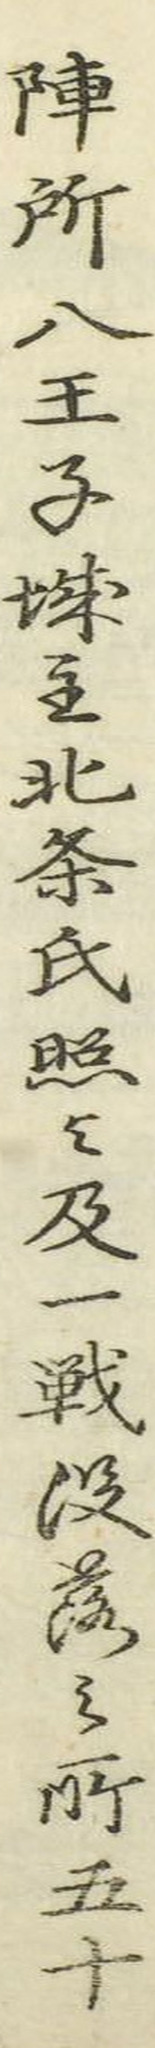陣所八王子城主北条氏照与及一戦没落之所五十
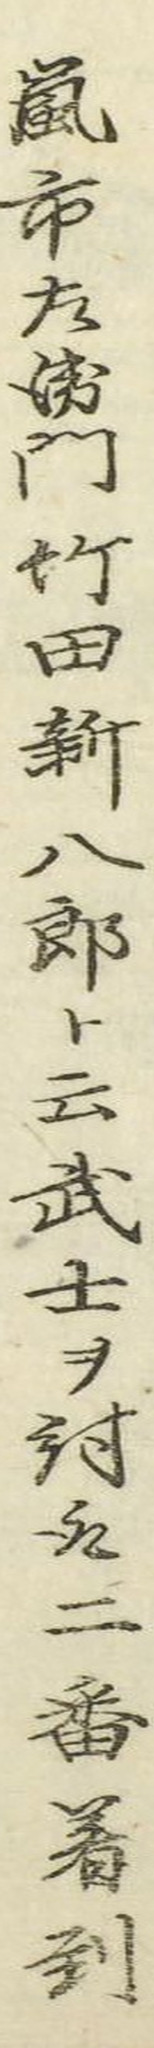嵐市左衛門竹田新八郎ト云武士ヲ討取二番着到
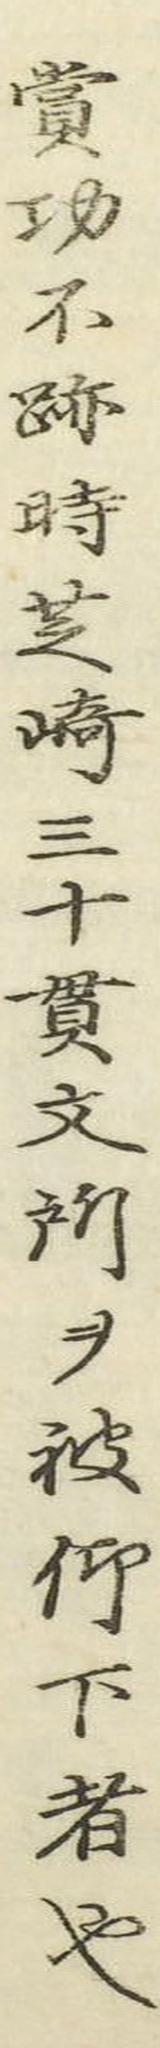賞功不跡時芝崎三十貫文所ヲ被仰下者也
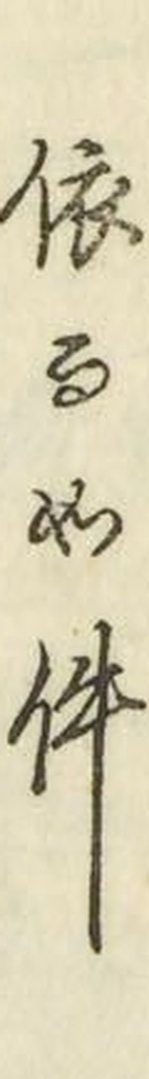依而如件
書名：江戸名所図会 20巻 巻之10
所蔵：東京学芸大学教育コンテンツアーカイブ
